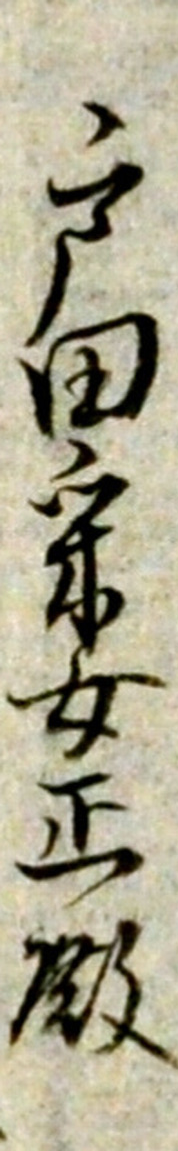戸田采女正殿
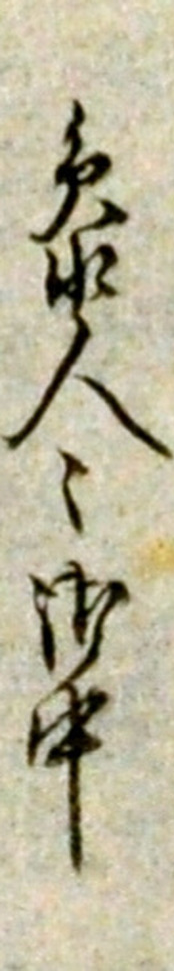番人々御中
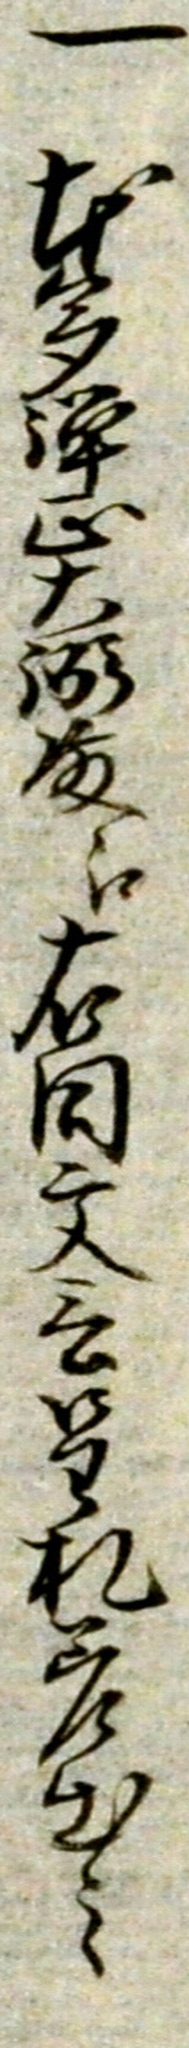一本多弾正大弼殿江右同文言呈札差出之
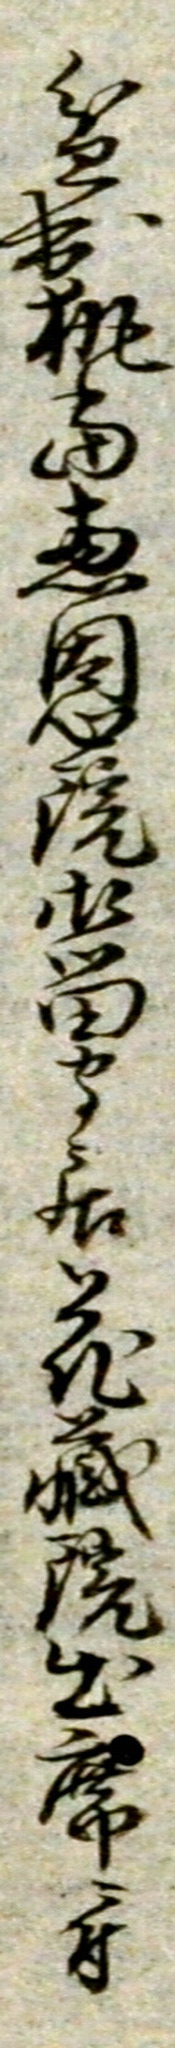盆出執当恵恩院御留守居花蔵院出席ニ付
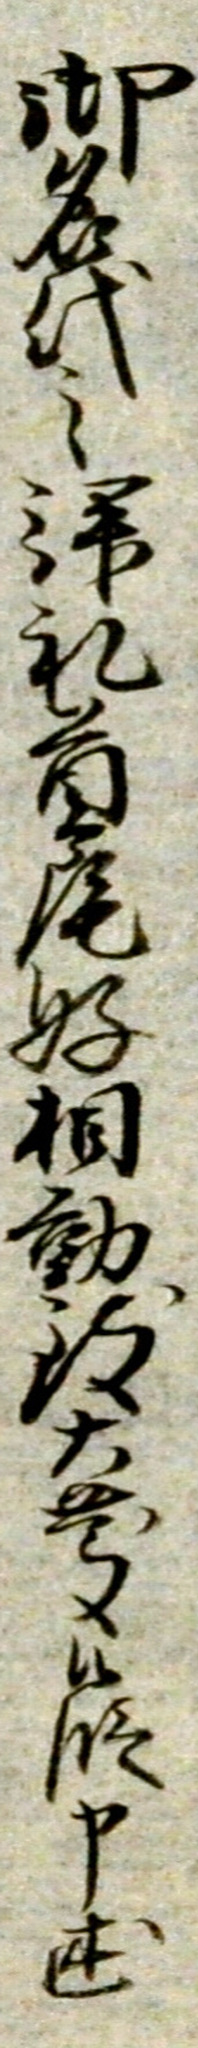御名代之拝礼首尾好相勤致大慶候段申述
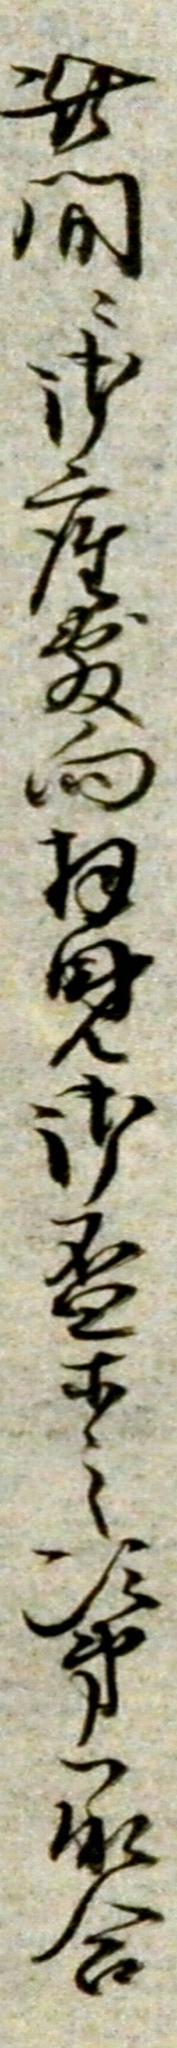此間ニ御座敷向拝見御盃等之次第承合

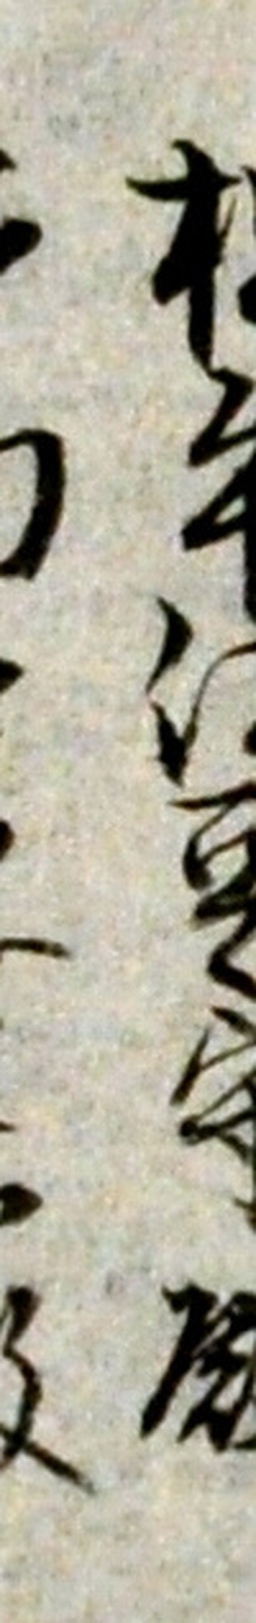松平伊豆守殿
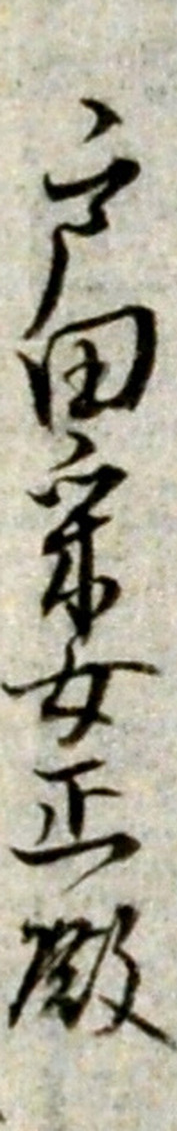戸田釆女正殿
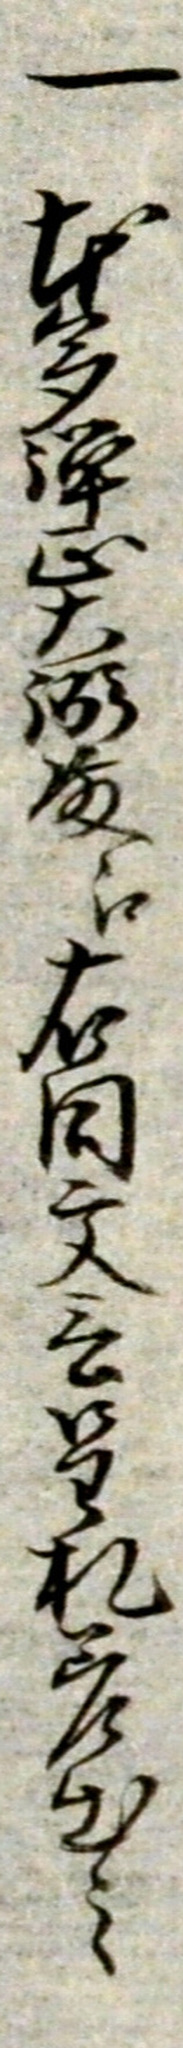一本多弾正大弼殿江右同文言呈札差出之
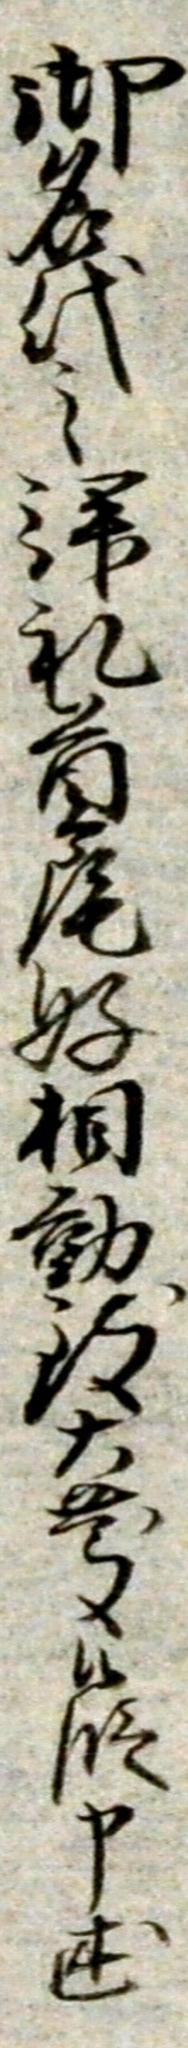御名代之拝礼首尾好相勤致大慶候段申述
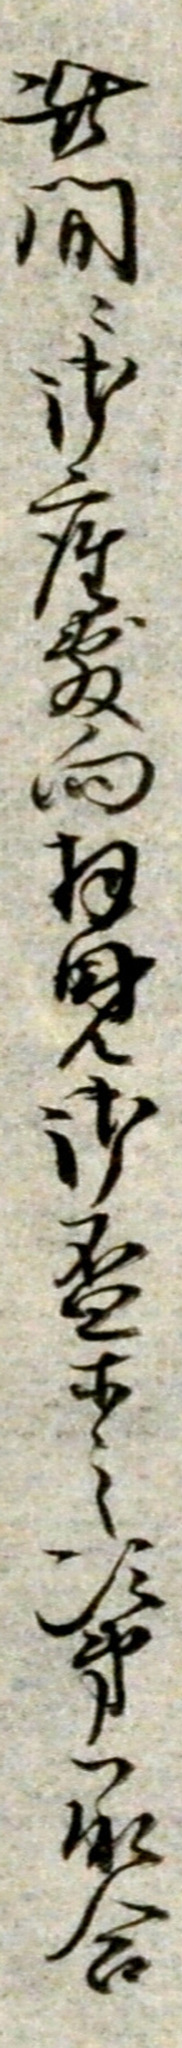此間ニ御座敷向拝見御盃等之次第承合
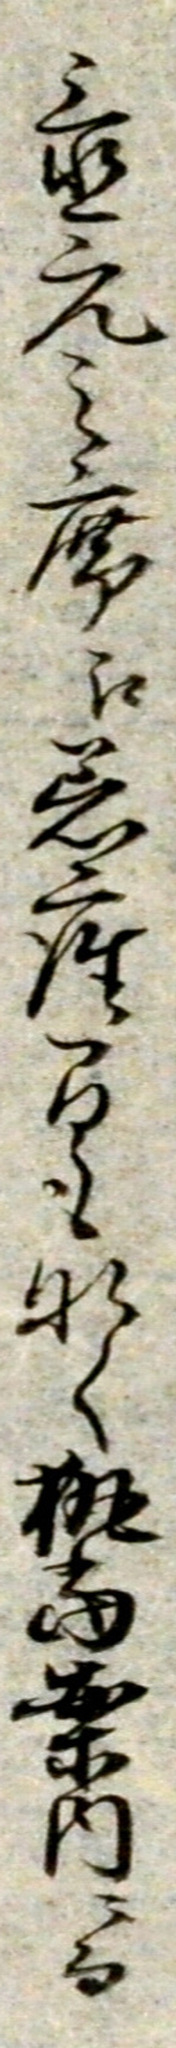置元之席江着座間もなく執當案内ニ而
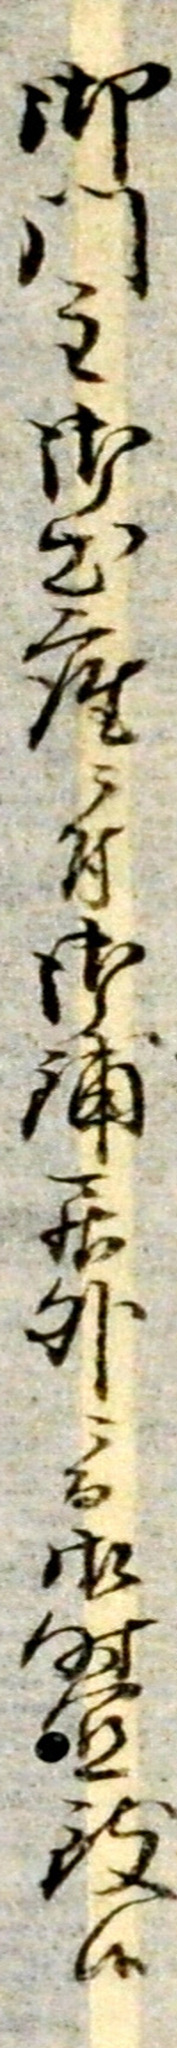御門主御出座ニ付御鋪居外ニ而御時宜致候
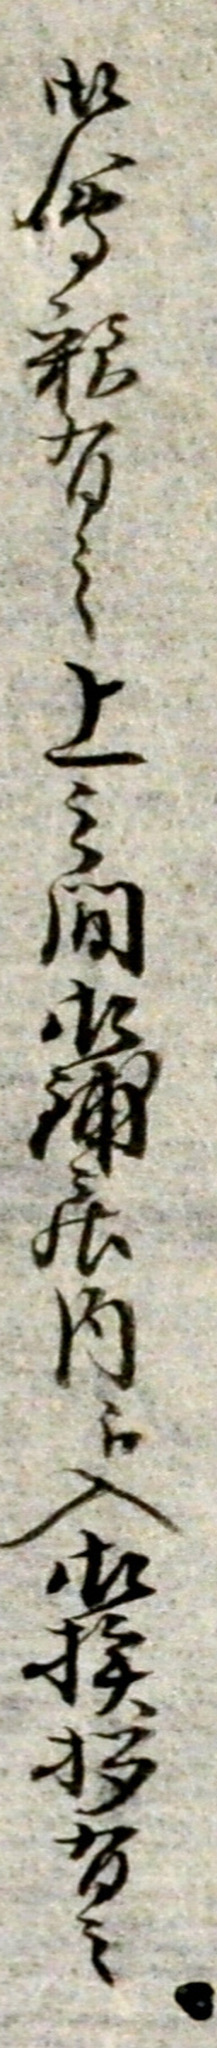御会釈有之上之間御鋪居内江入御挨拶有之
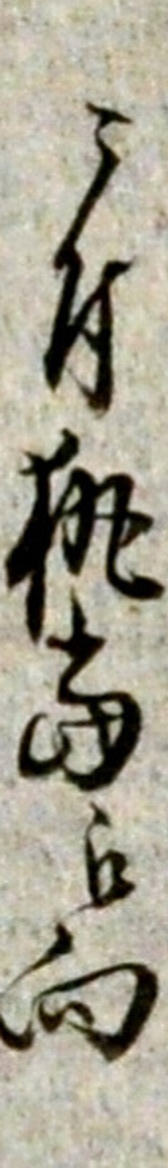ニ付執当江向
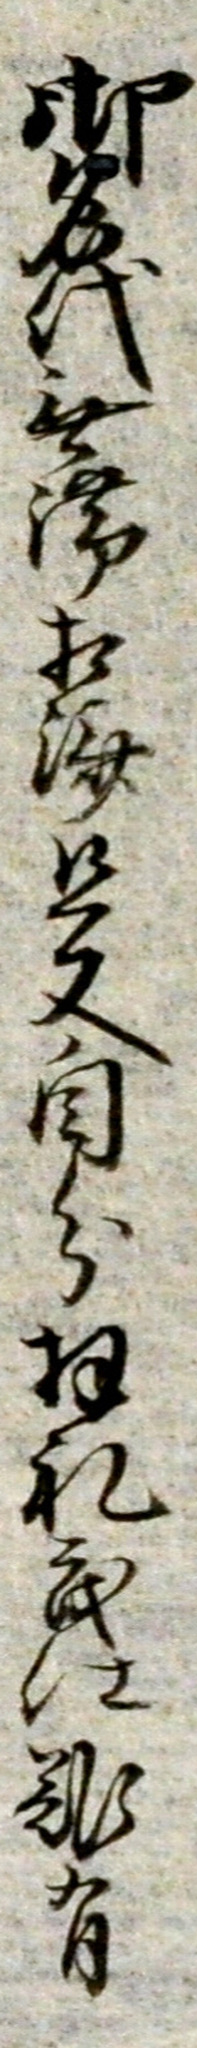御名代無滞相済且又自分拝礼も仕難有
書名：日光御名代相勤候節ノ留
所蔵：伊那市立高遠町図書館・合同会社AMANE
